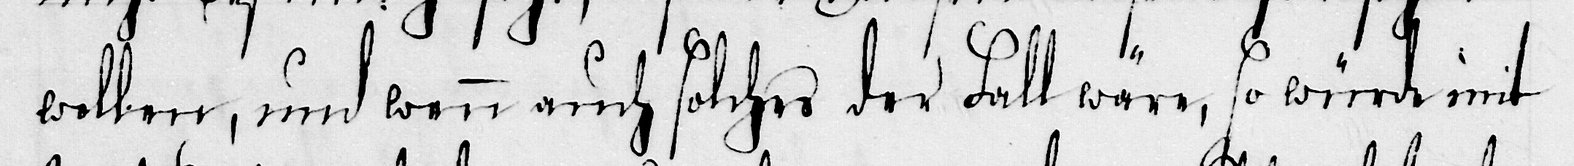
wollen, und wenn auch solches der Fall wäre, so würde mit
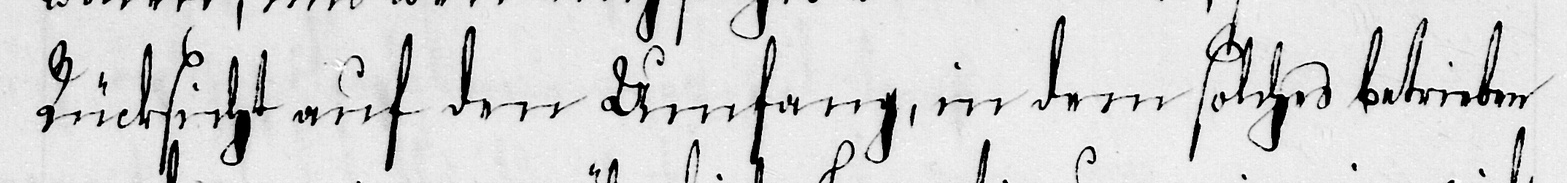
Rücksicht auf den Umfang, in dem solches betrieben
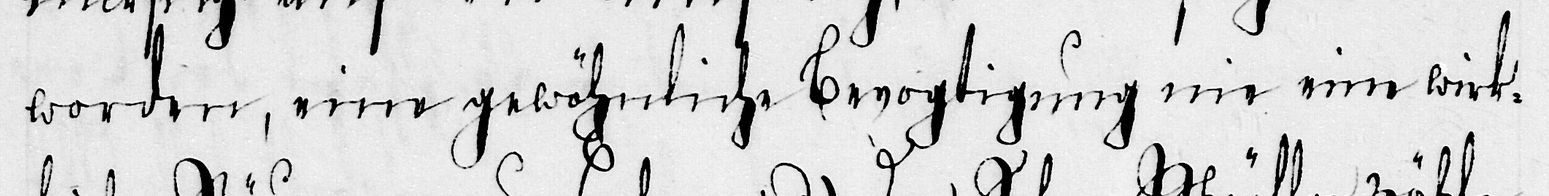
worden, eine gewöhnliche Bevogtigung nie eine wirk¬
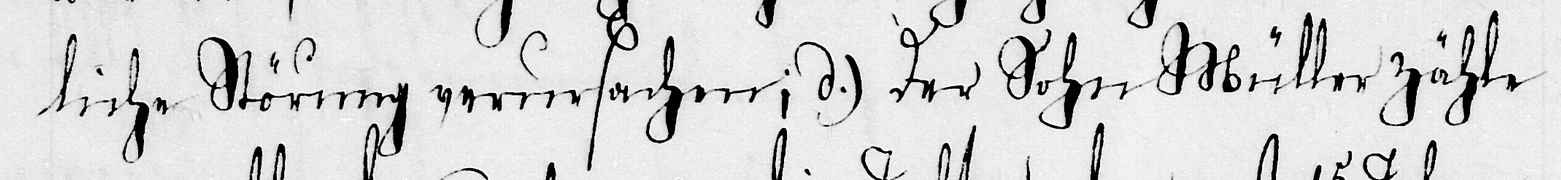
liche Störung verursachen, d.) Der Sohn Müller zähle
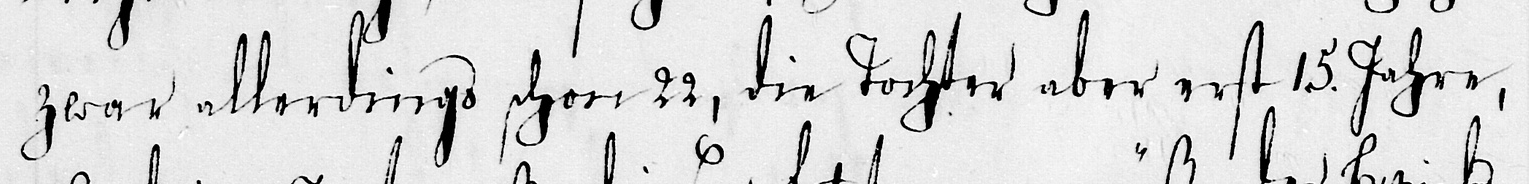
zwar allerdings schon 22, die Tochter aber erst 15. Jahre,
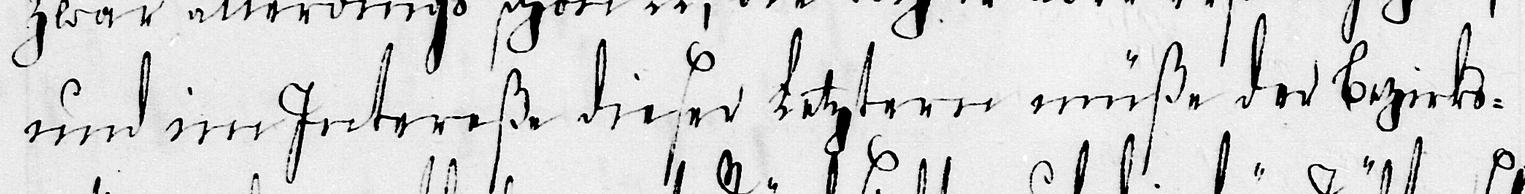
und im Intereße dieser Letztern müße der Bezirks¬
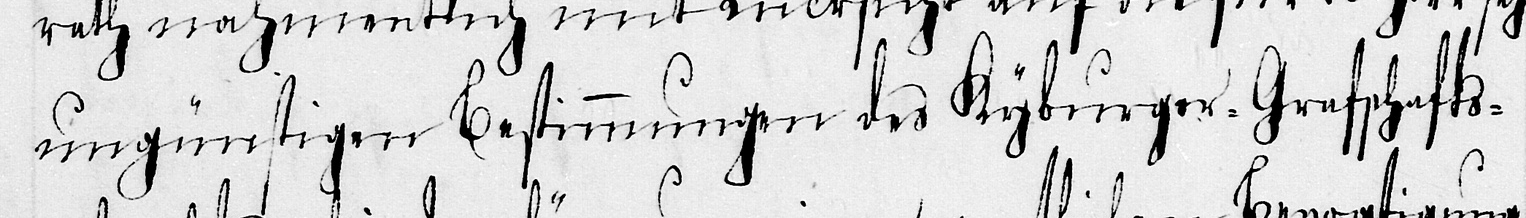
ungünstigen Bestimmungen des Kyburger-Grafschafts¬
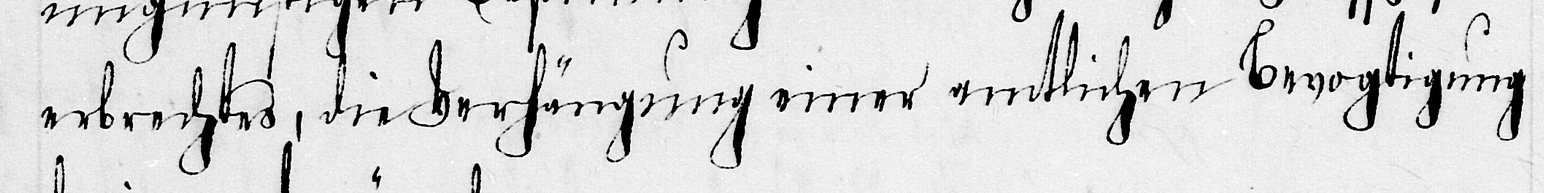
erbrechtes, die Verhängung einer amtlichen Bevogtigung
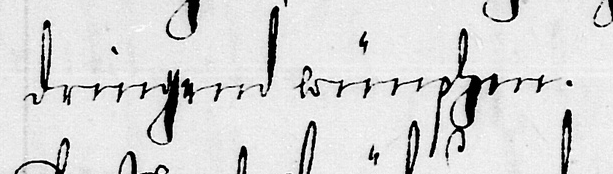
dringend wünschen.
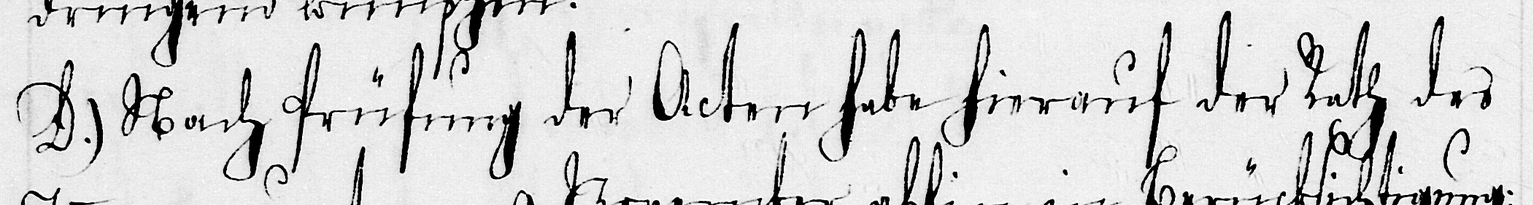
D.) Nach Prüfung der Acten habe hierauf der Rath des
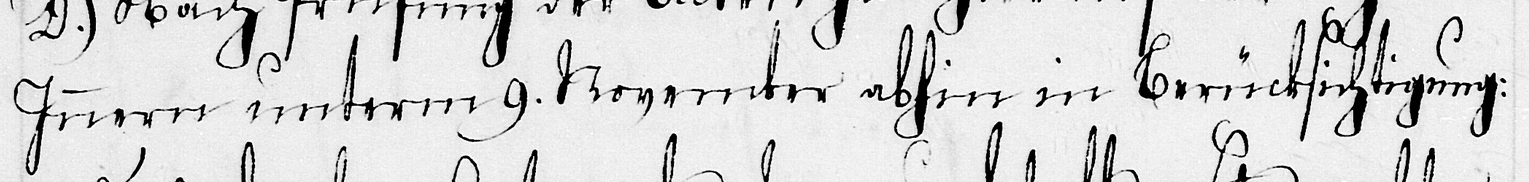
Innern unterem 9. November abhin in Berücksichtigung:
